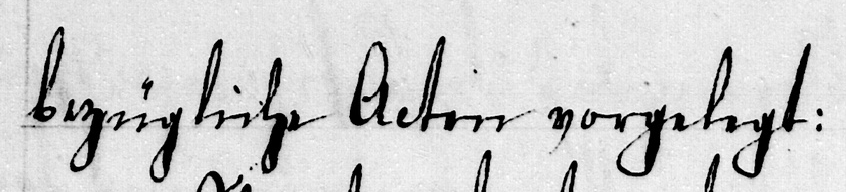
bezügliche Acten vorgelegt:
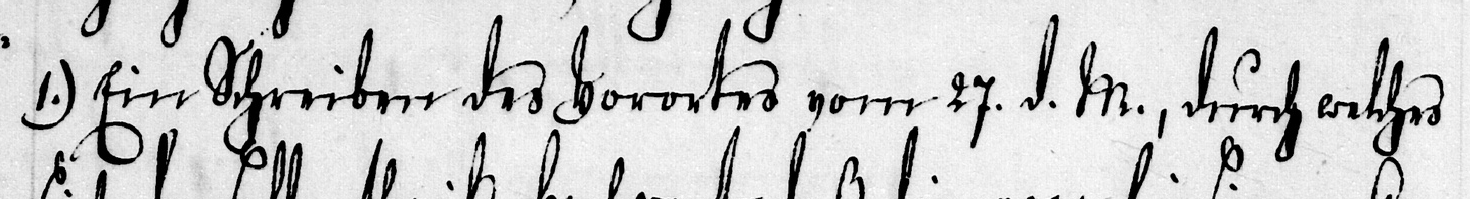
1.) Ein Schreiben des Vorortes vom 27. d. M., durch welches
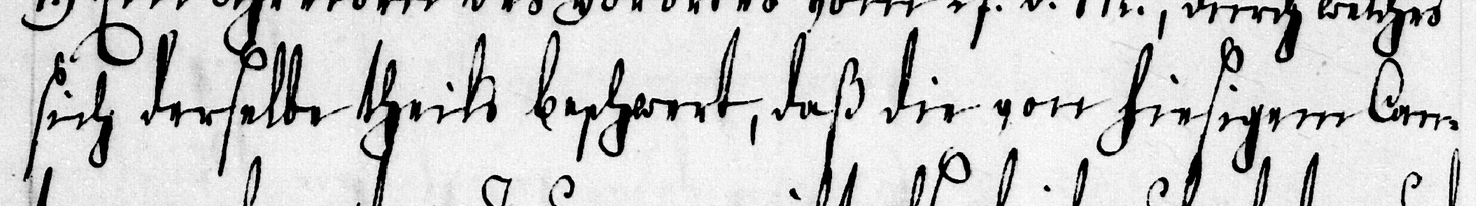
ich derselbe theils beschwert, daß die von hiesigem Can¬
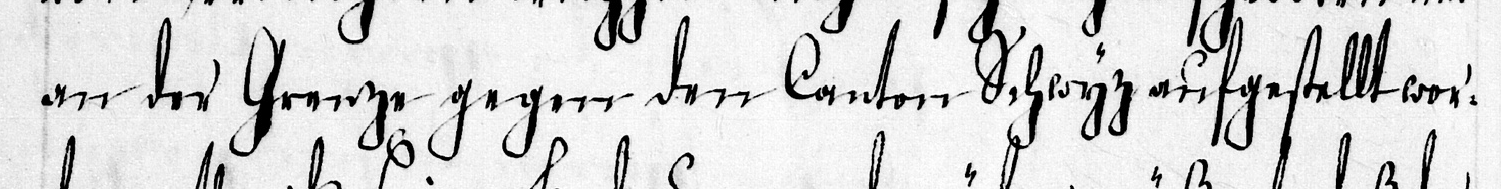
an der Grenze gegen den Canton Schwyz aufgestellt wor¬
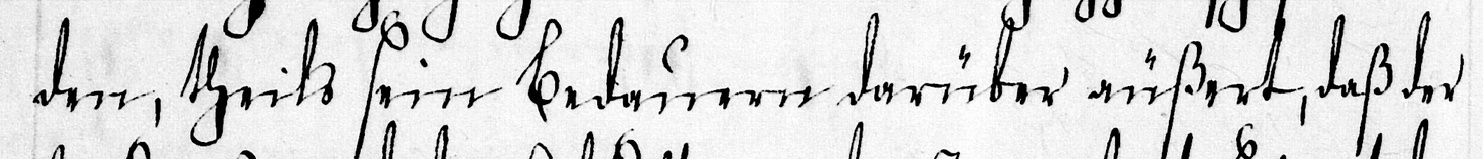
den, theils sein Bedauern darüber äußert, daß der
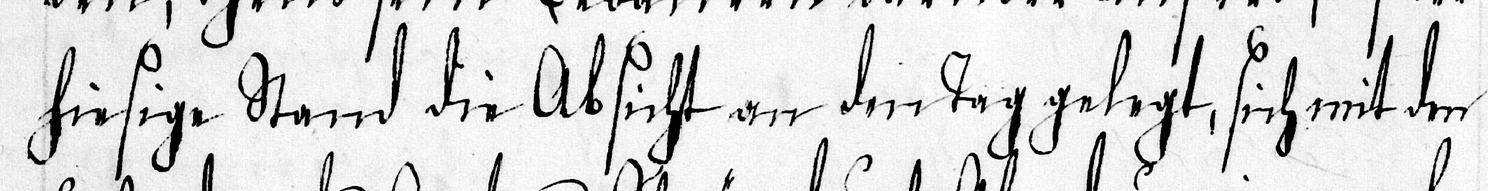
hiesige Stand die Absicht an den Tag gelegt, sich mit
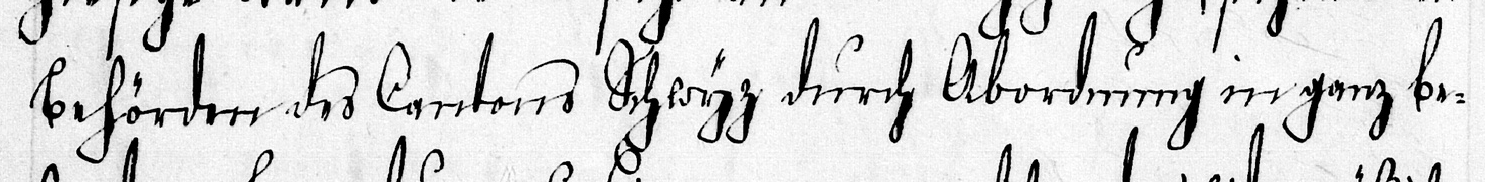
Behörden des Cantons Schwyz durch Abordnung in ganz be¬
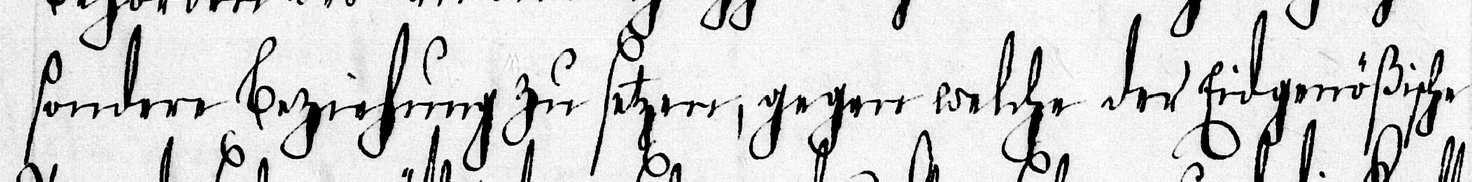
sondere Beziehung zu setzen, gegen welche der Eidgenößische
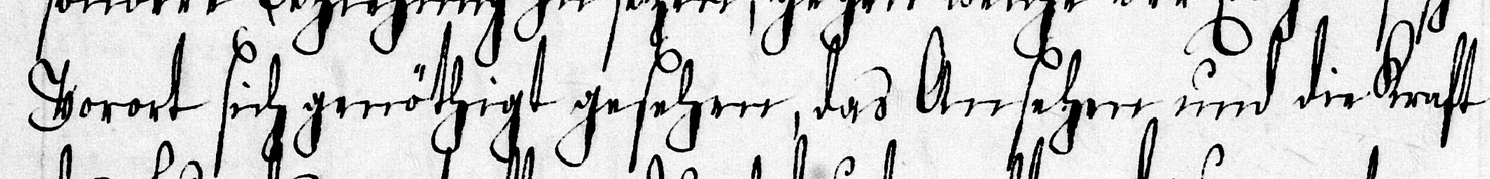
Vorort sich genöthigt gesehen, das Ansehen und die Kraft
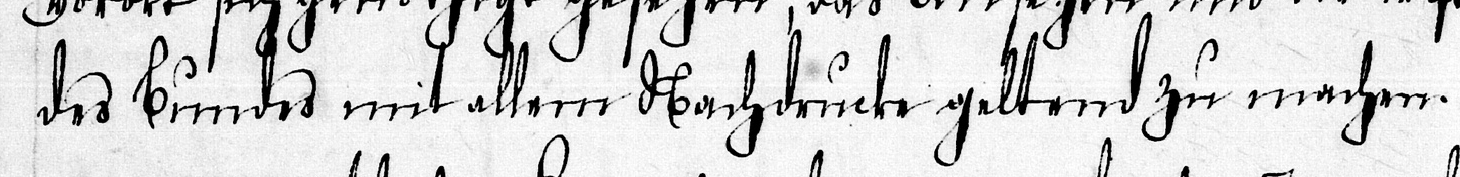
des Bundes mit allem Nachdrucke geltend zu machen.
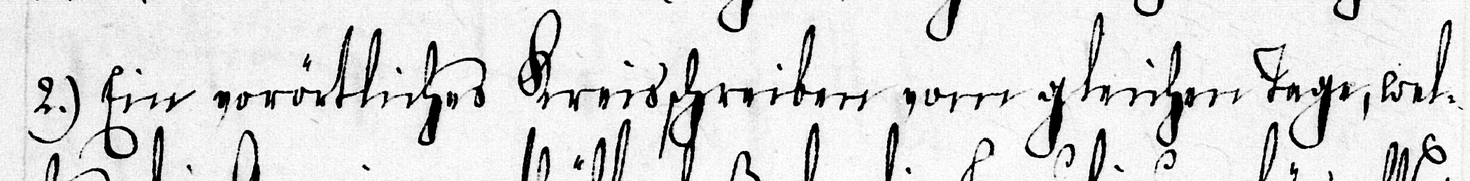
2.) Ein vorörtliches Kreisschreiben vom gleichen Tage, wel¬
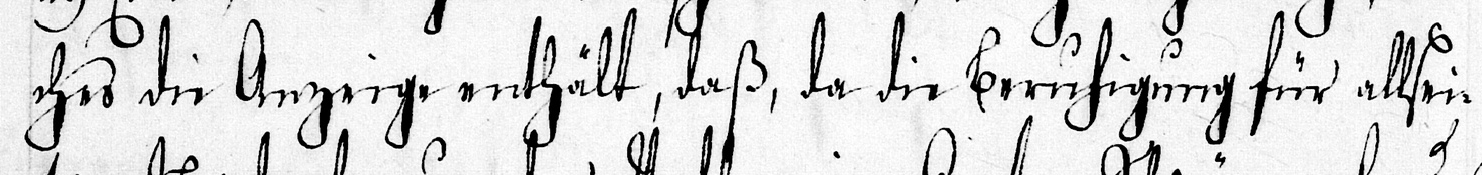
ches die Anzeige enthält, daß, da die Beruhigung für allse¬
